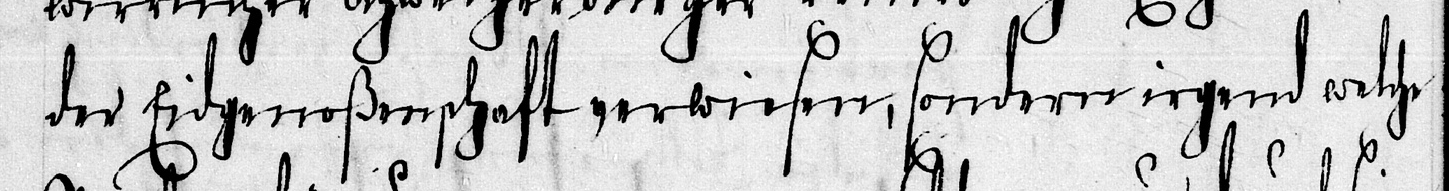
der Eidgenoßenschaft verwiesen, sondern irgend welche
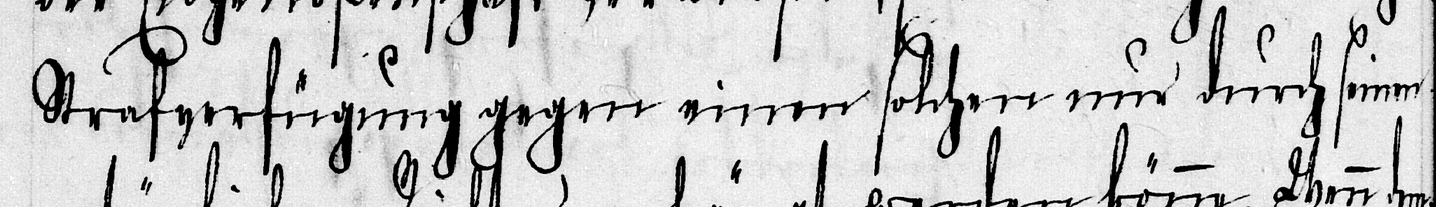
Strafverfügung gegen einen solchen nur durch sein¬
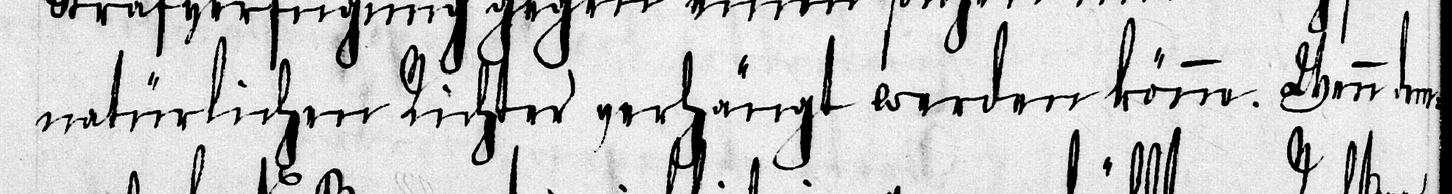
natürlichen Richter verhängt werden könne. Wenn
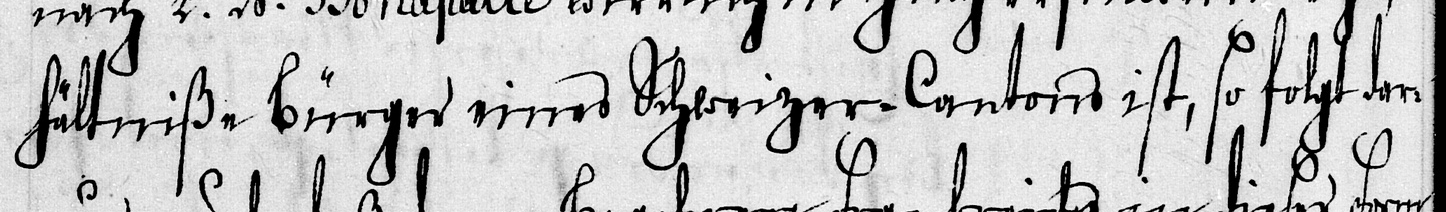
hältniße Bürger eines Schweizer-Cantons ist, so folgt d¬
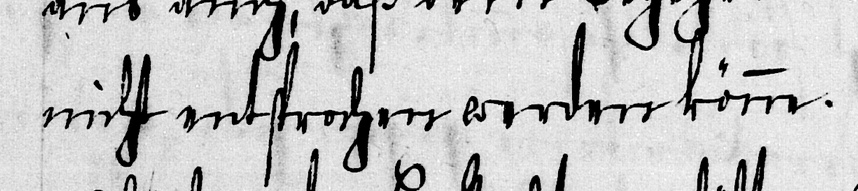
nicht entsprochen werden könne.
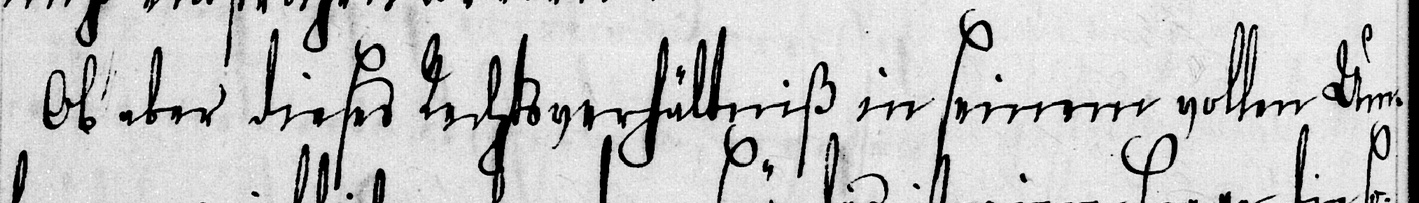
Ob aber dieses Rechtsverhältniß in seinem vollen Um¬
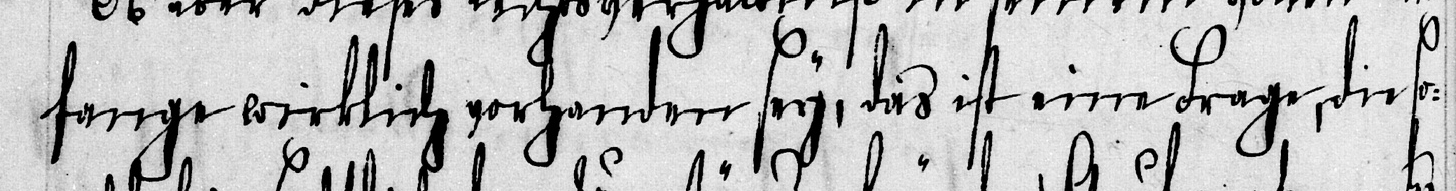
fange wirklich vorhanden sey, das ist eine Frage, die
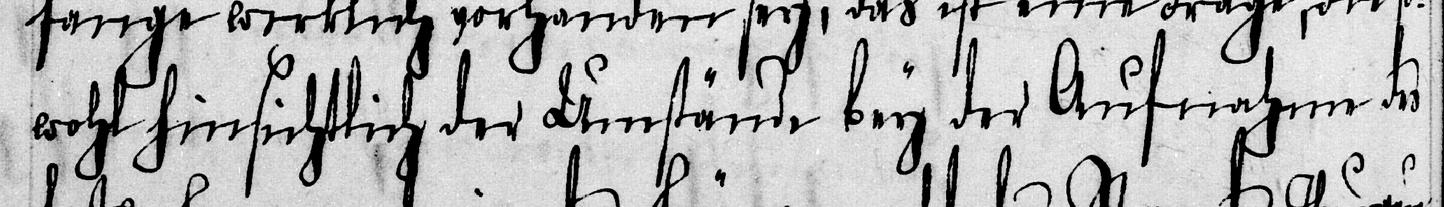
wohl hinsichtlich der Umstände bey der Aufnahme des
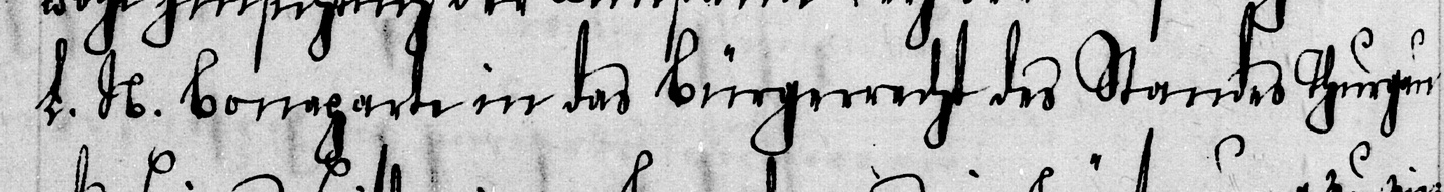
L. N. Bonaparte in das Bürgerrecht des Standes Thurgau
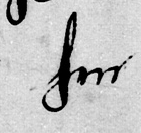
ver¬
